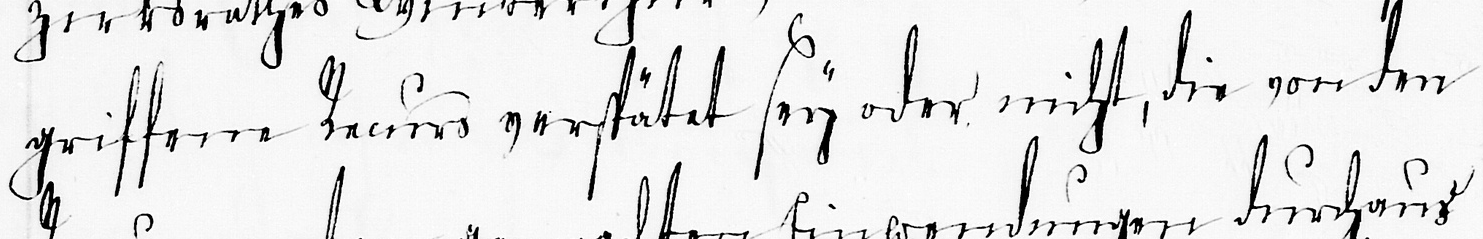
griffene Recurs verspätet sey oder nicht, die von den
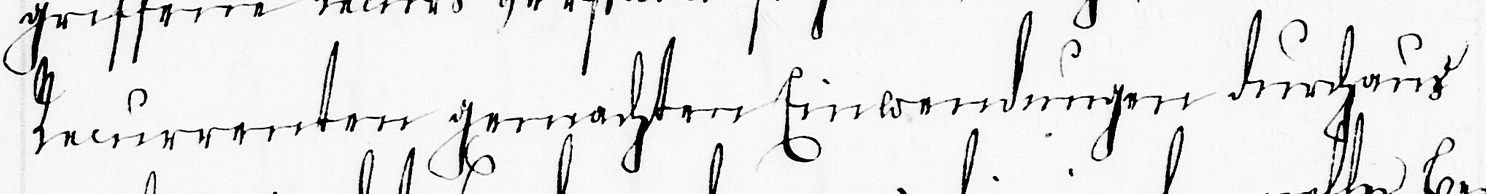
Recurrenten gemachten Einwendungen durchaus
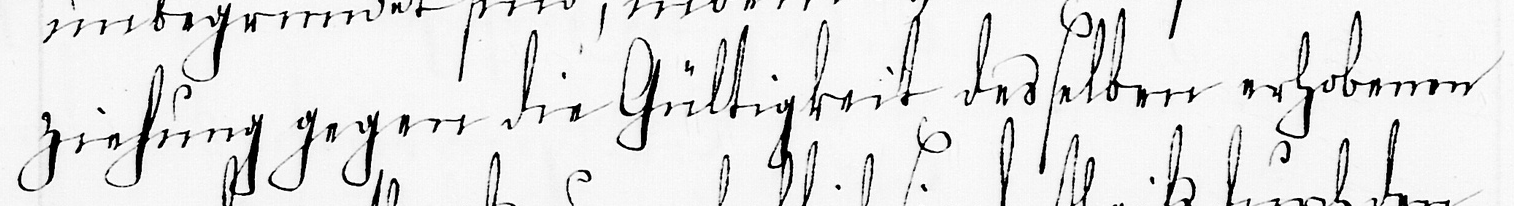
ziehung gegen die Gültigkeit desselben erhobenen
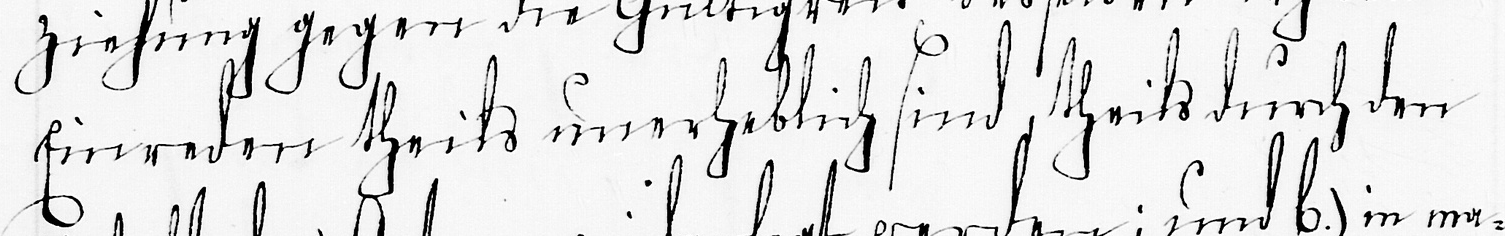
Einreden theils unerheblich sind, theils durch den
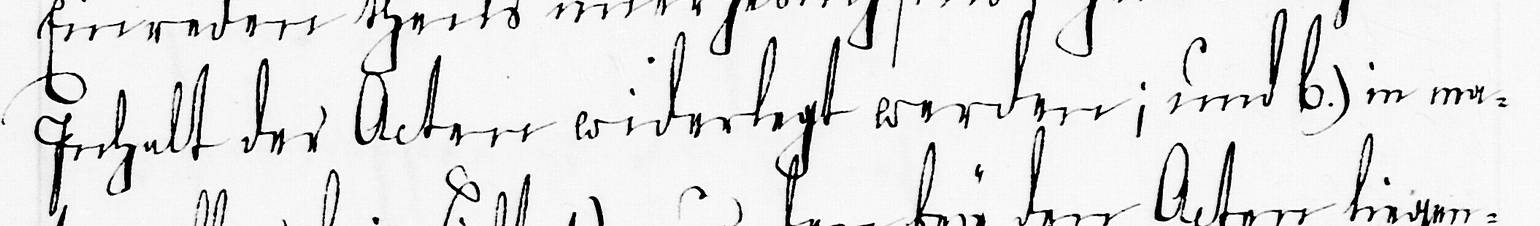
Inhalt der Acten widerlegt werden; und
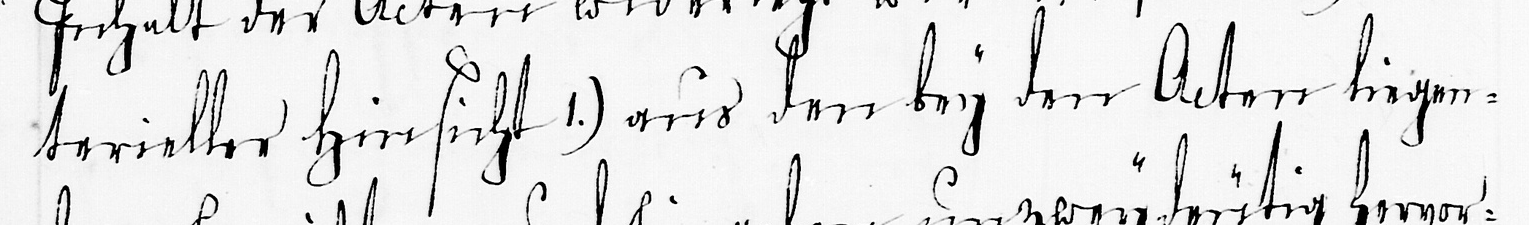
terieller Hinsicht 1.) aus den bey den Acten liegen¬
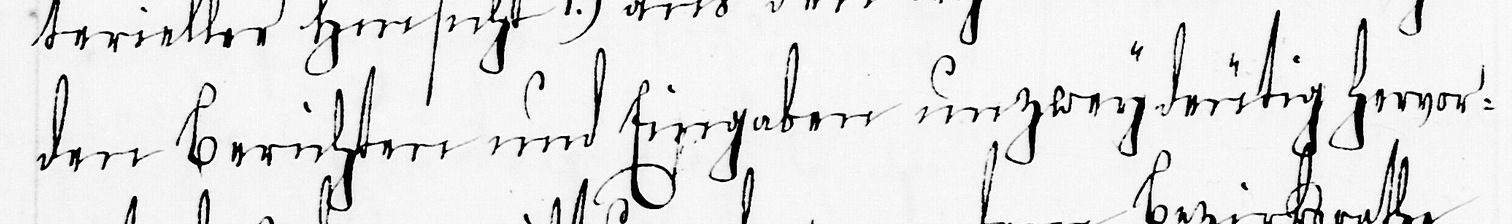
den Berichten und Eingaben unzweydeutig hervor¬
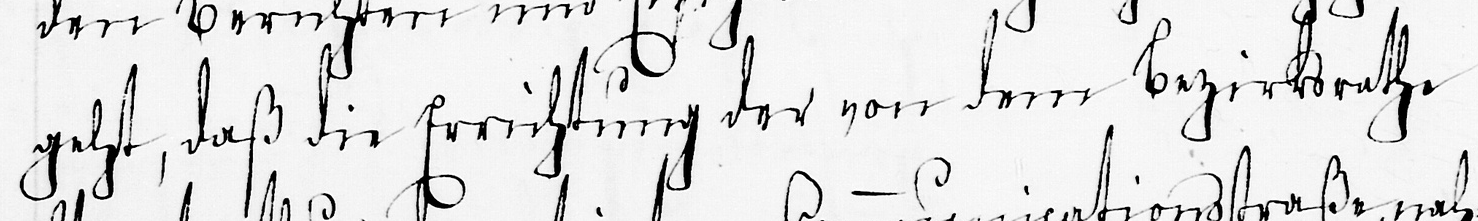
geht, daß die Errichtung der von dem Bezirksrathe
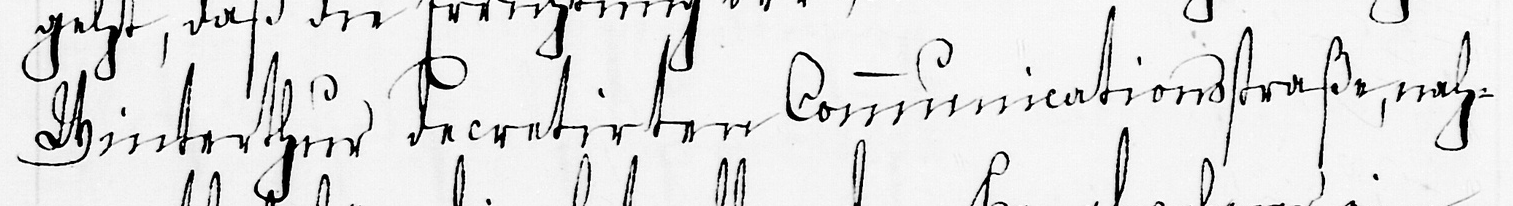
Winterthur decretirten Communicationsstraße, nah¬
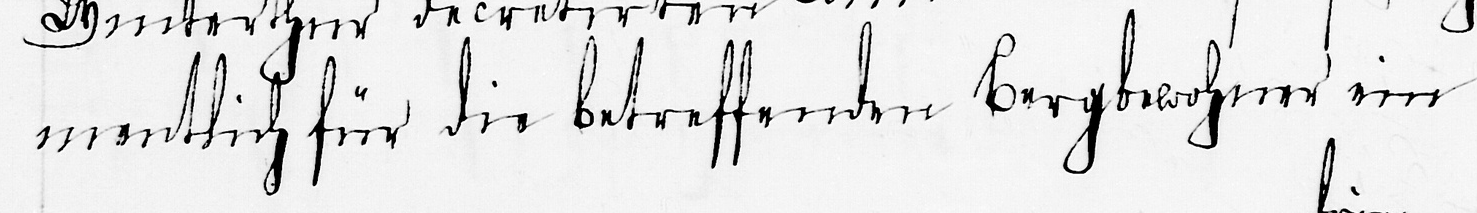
mentlich für die betreffenden Bergbewohner ein
